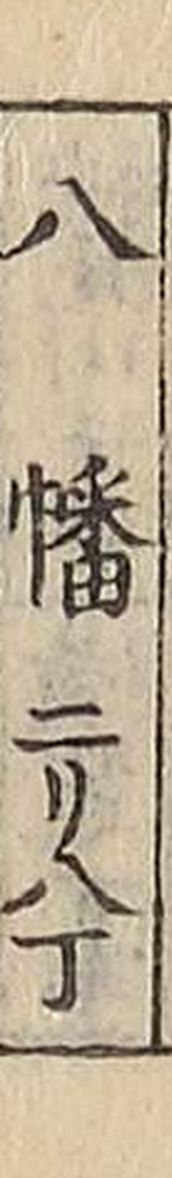八幡二リ八丁
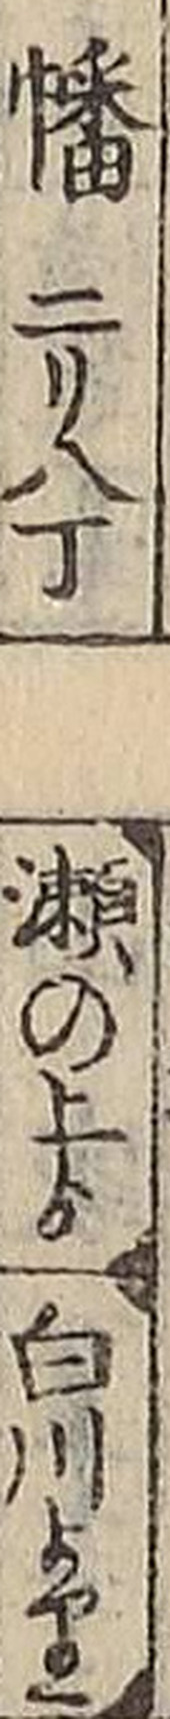八幡二リ八丁
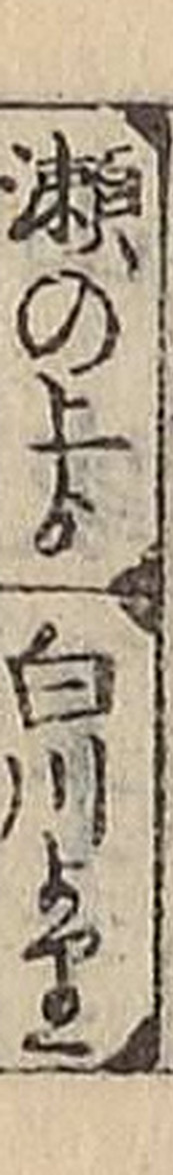瀬の上ゟ白川より
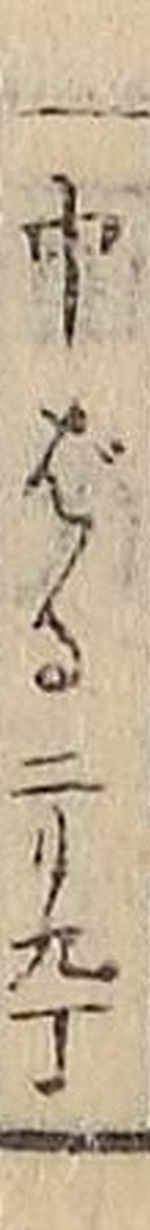中ばる二リ九丁
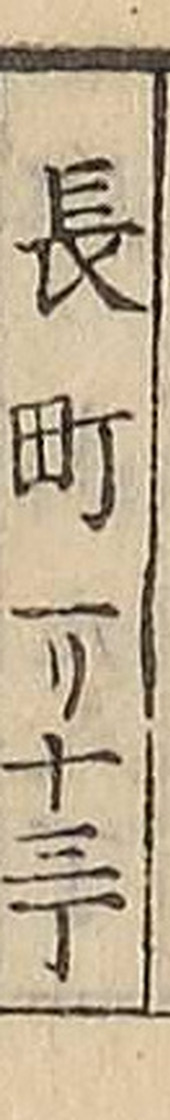長町一リ十三丁
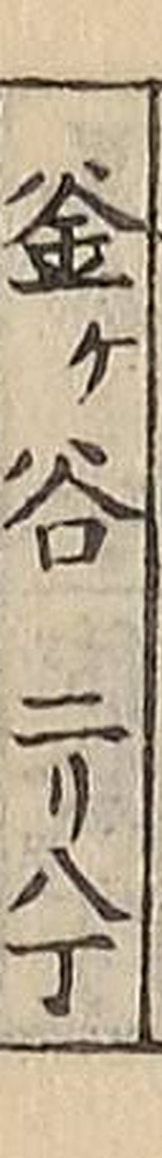金ケ谷二リ八丁
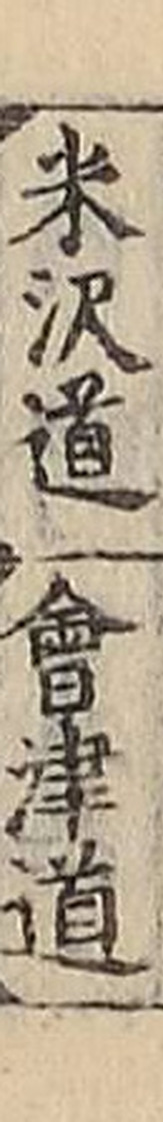米沢道会津道
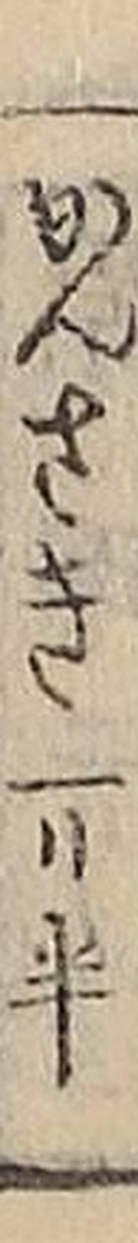かんさき一リ半
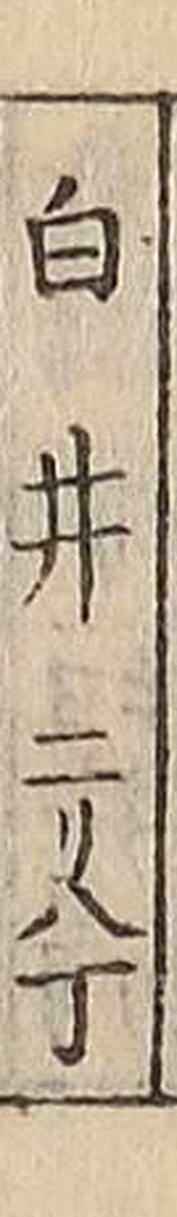白井二リ八丁
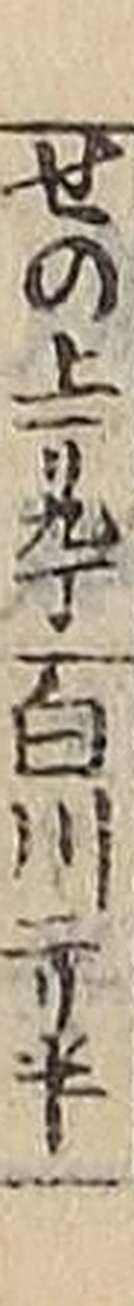せの上一リ九丁白川二リ半
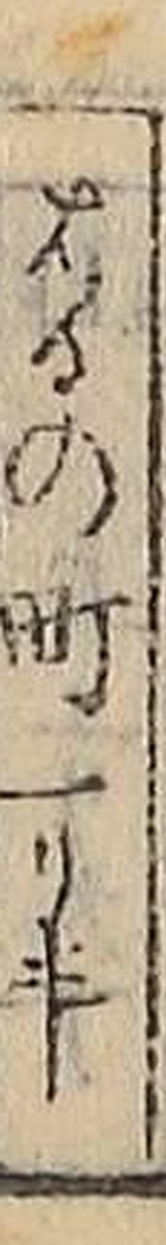はるの町一リ半
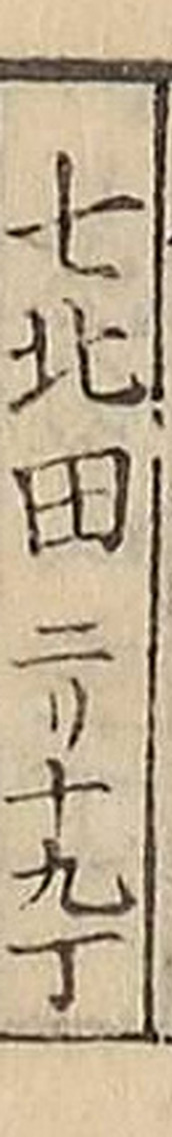七北田二リ十九丁
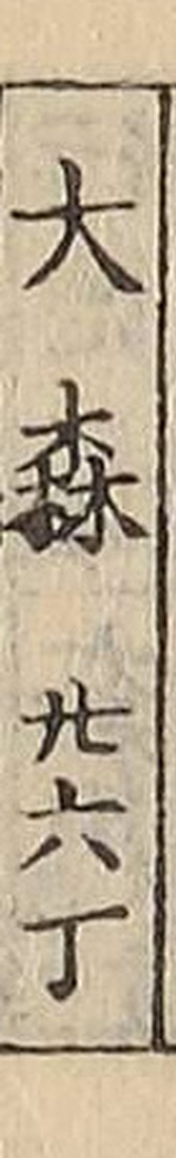大森廿六丁
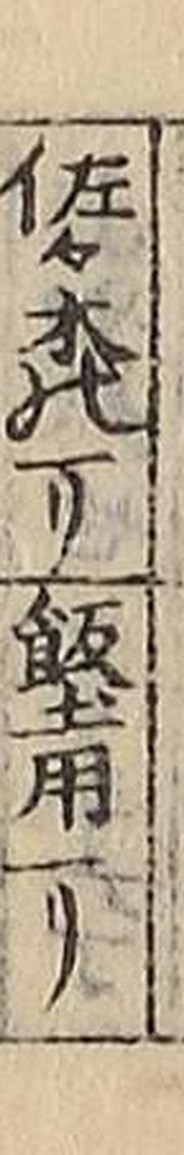佐々木の一リ飯土用一リ
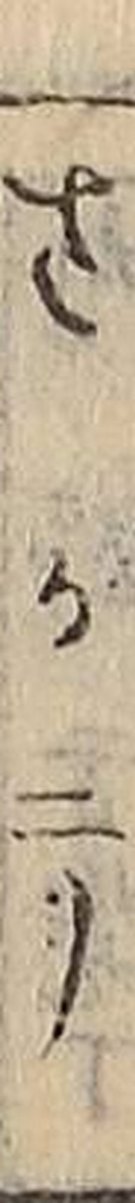さか二リ
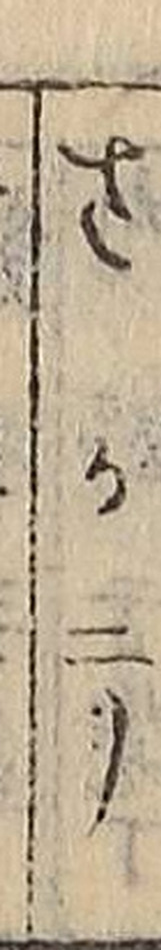さか二リ
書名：旅行用心集
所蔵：神戸大学附属図書館 国文学研究資料館
